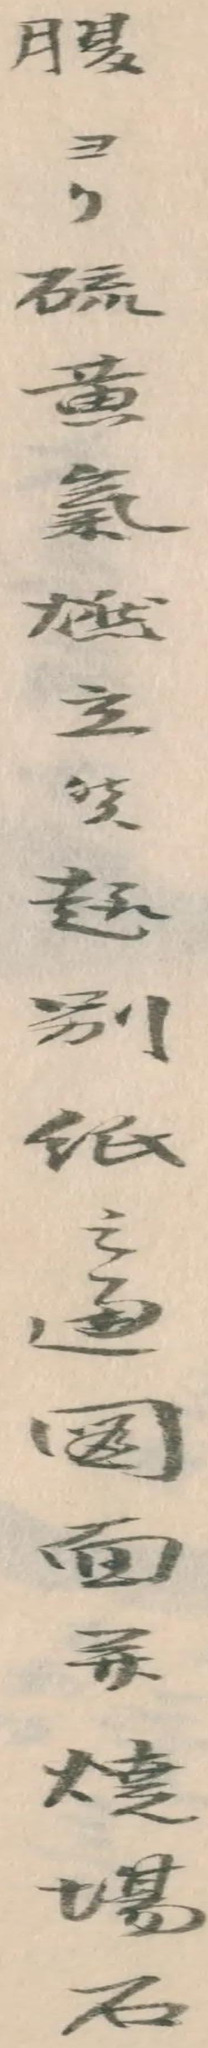腹ヨリ硫黄気燃立候趣別紙之通図面并焼場石
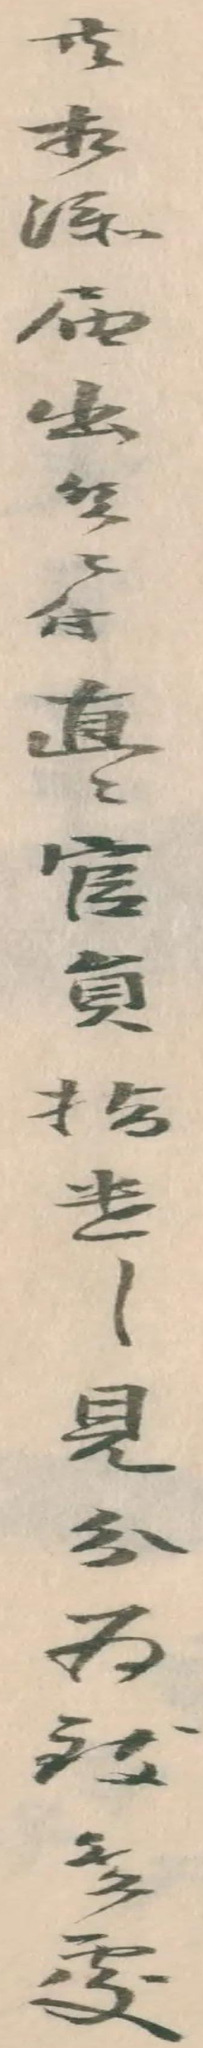共相添届出候ニ付直ニ官員指遣し見分為致候処
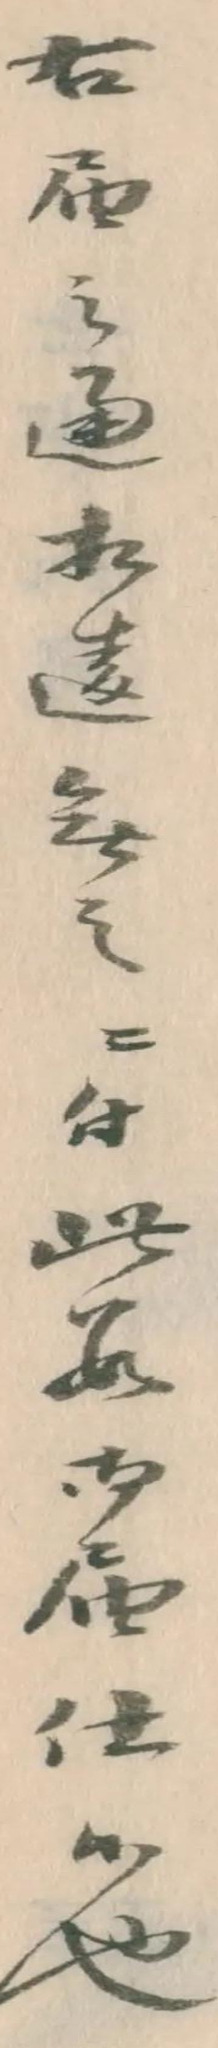右届之通相違無之ニ付此数御届仕候也

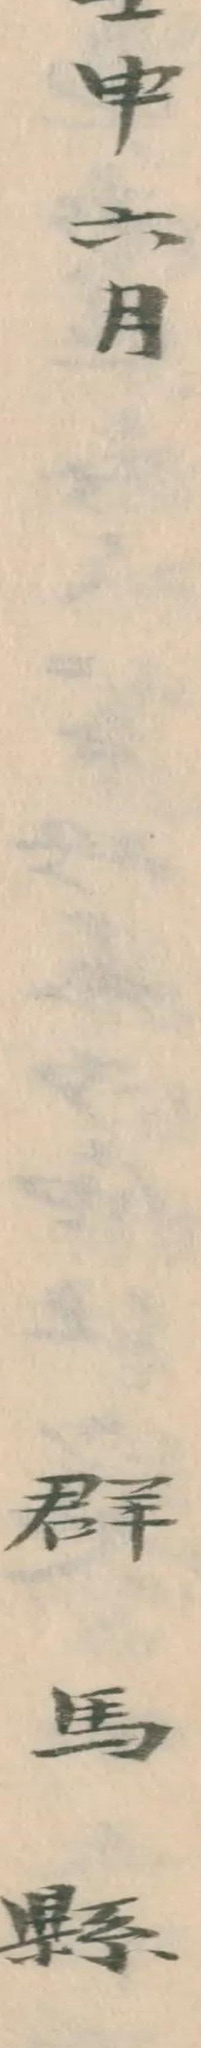壬申六月群馬県
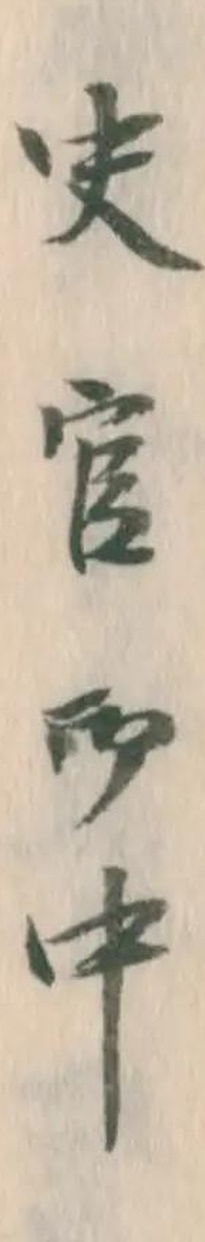吏官御中
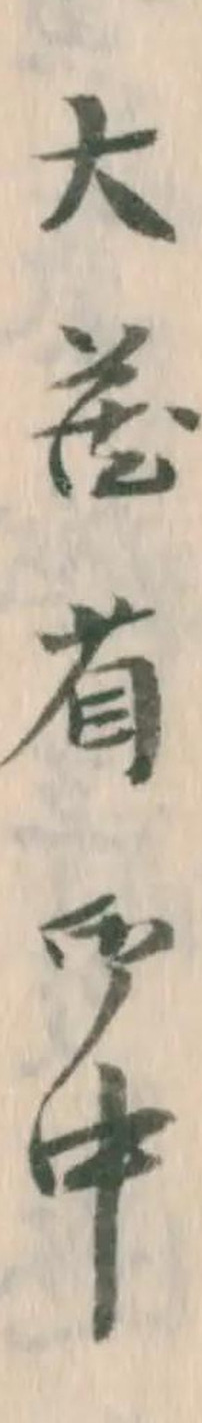大蔵省御中

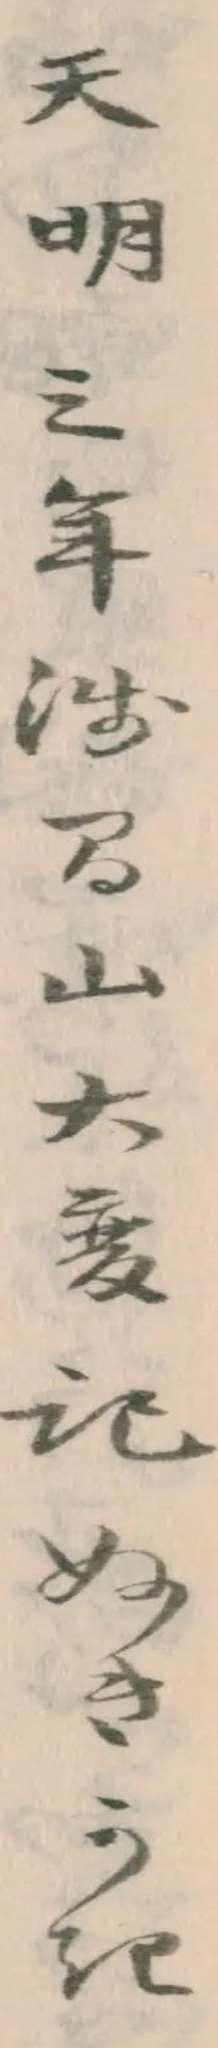天明三年浅間山大変記ぬきかき
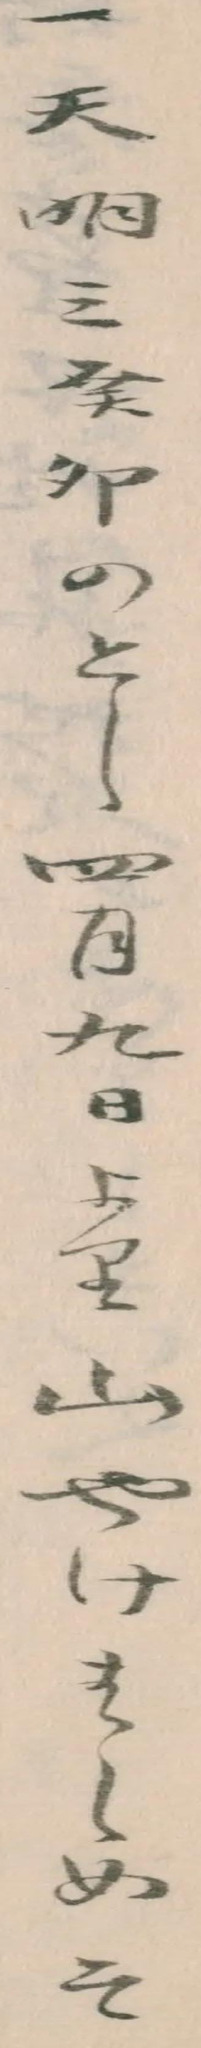一天明三癸卯のとし四月九日より山やけはしめそ
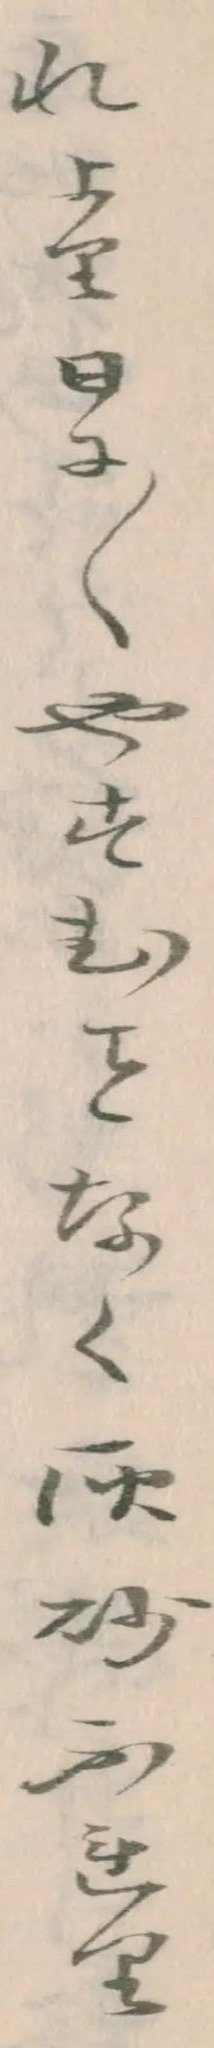れより日に〳〵やすむことなく灰砂ふれり
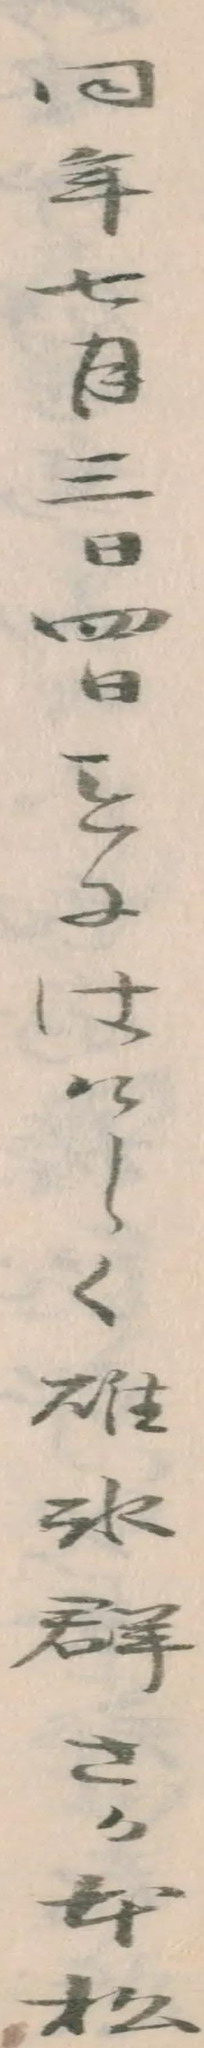一同年七月三日四日ことにはけしく碓氷群さか本松
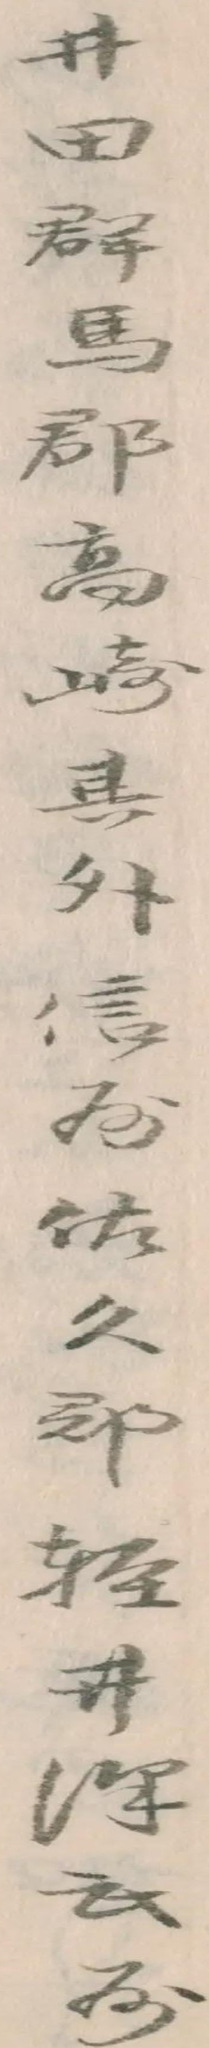井田群馬郡高崎其外信州佐久郡軽井沢武州
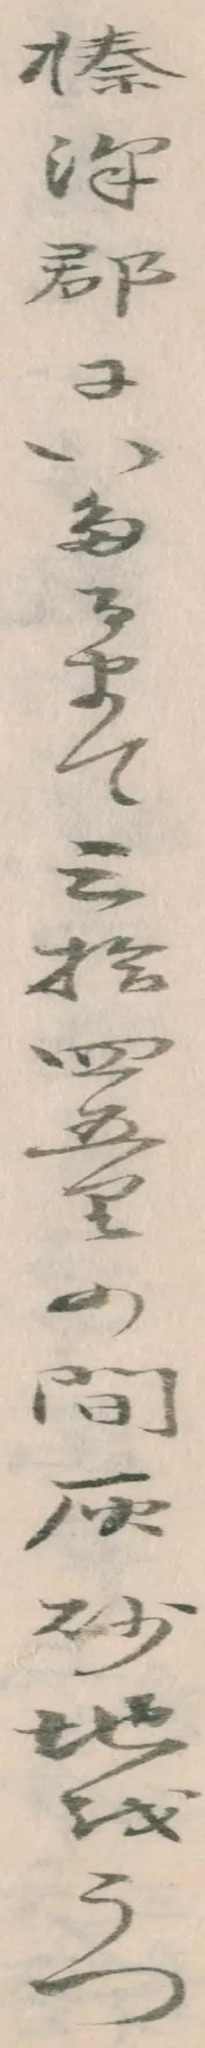榛沢郡にいたるまて三拾四五里の間灰砂地をうつ
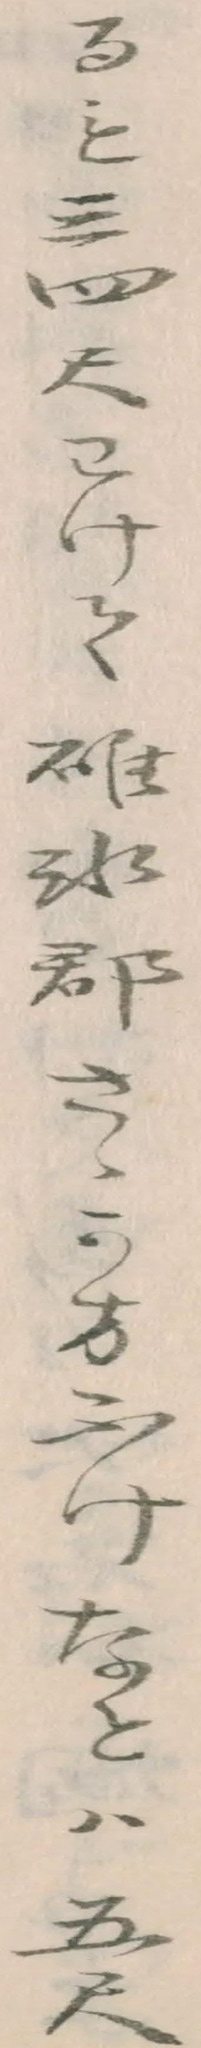ること三四尺わけて碓氷郡さゝか方ふけなとは五尺
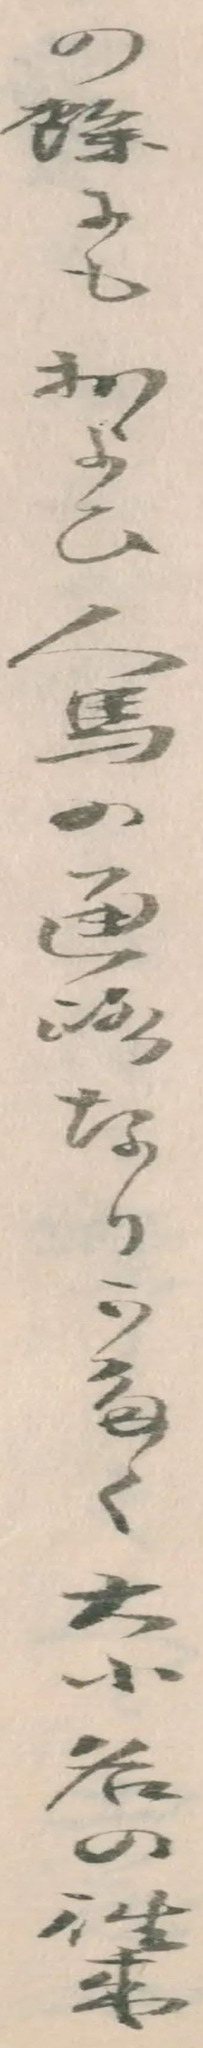の余にもおよひ人馬の通路なりかたく大小名の往来
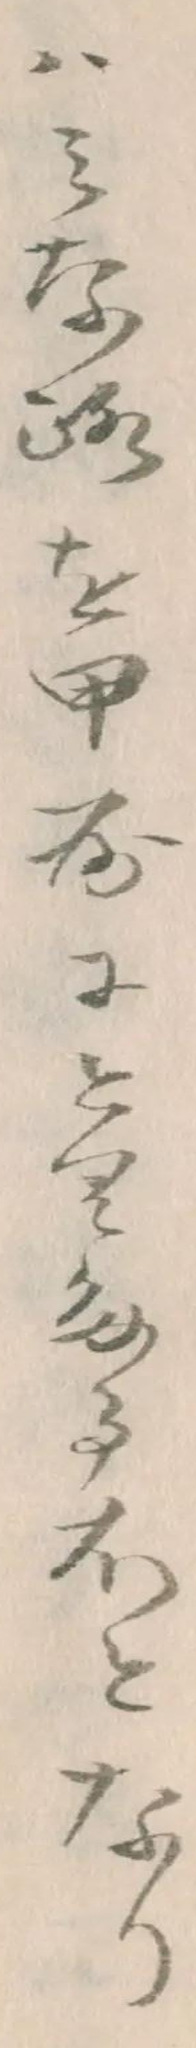はみな路を甲州にとりたるほとなり
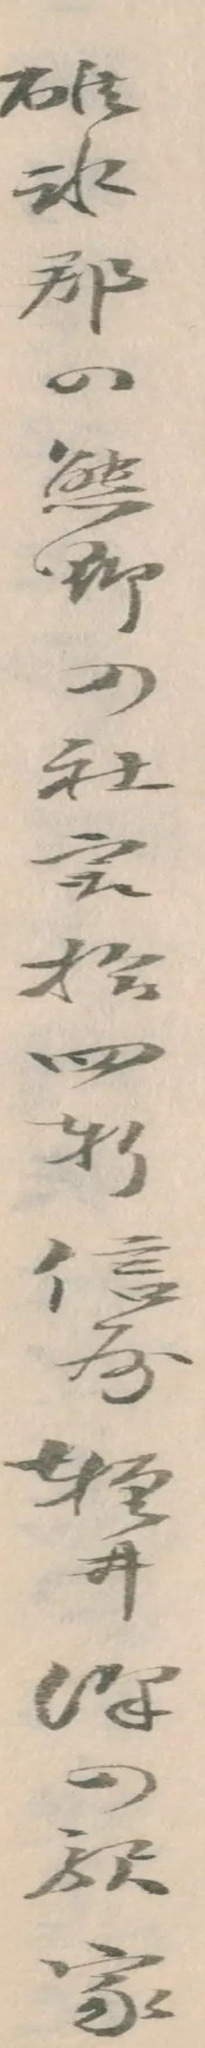一碓氷郡の熊野の社最拾四軒信州軽井沢の駅家
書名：地災撮要. 巻11-12(地震之部)
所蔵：国立国会図書館 National Diet Library, JAPAN
